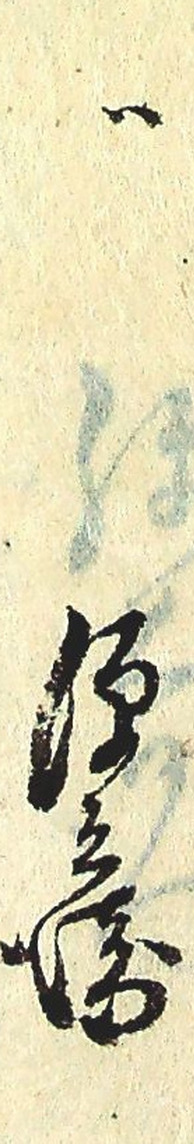同源兵衛
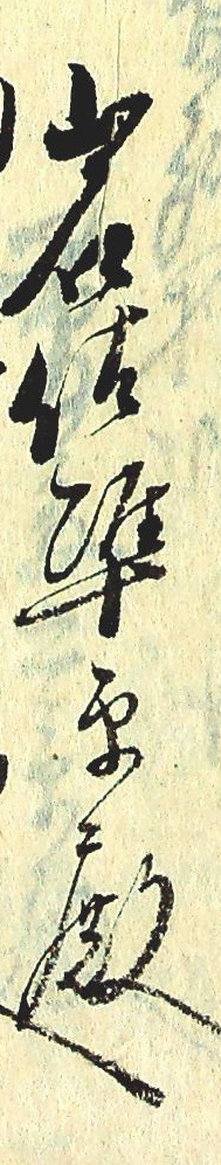岩佐準平殿
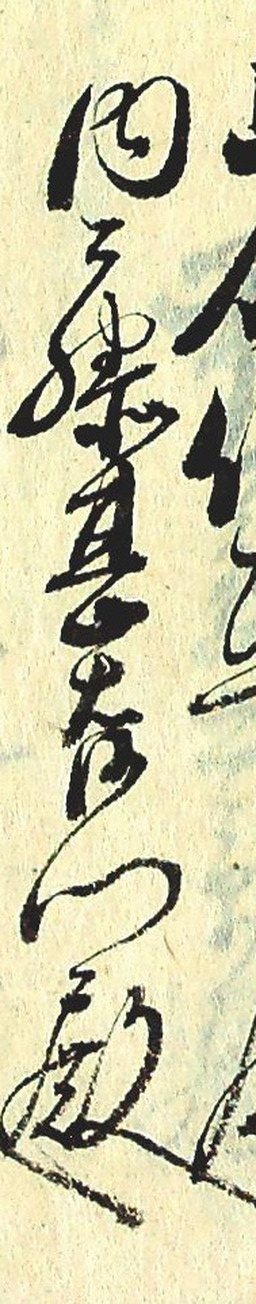内藤甚右衛門殿
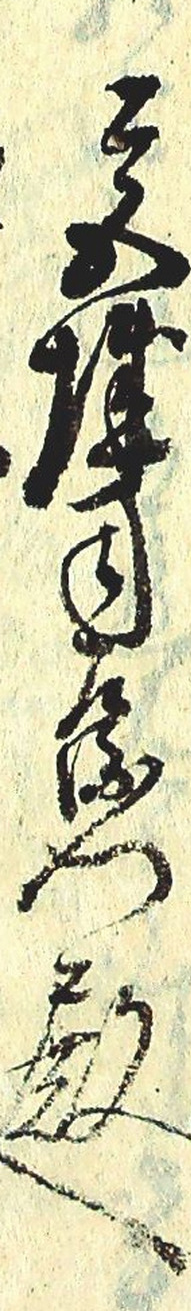宮城周左衛門殿
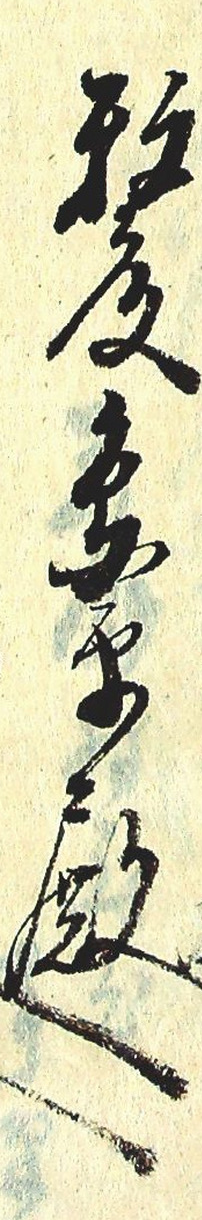数藤円平殿
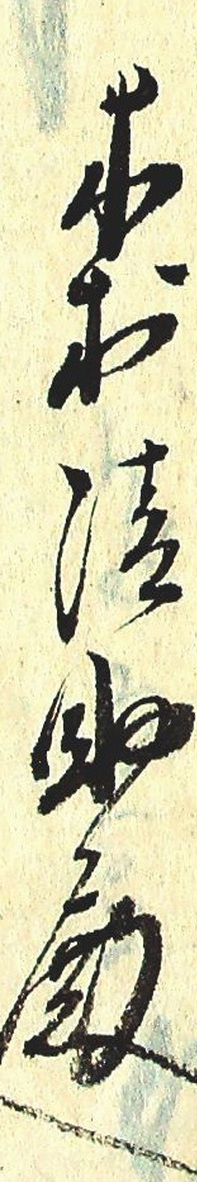木村清助殿
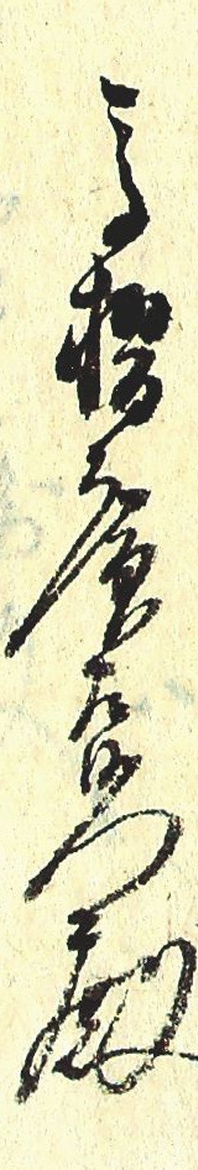高橋広左衛門殿

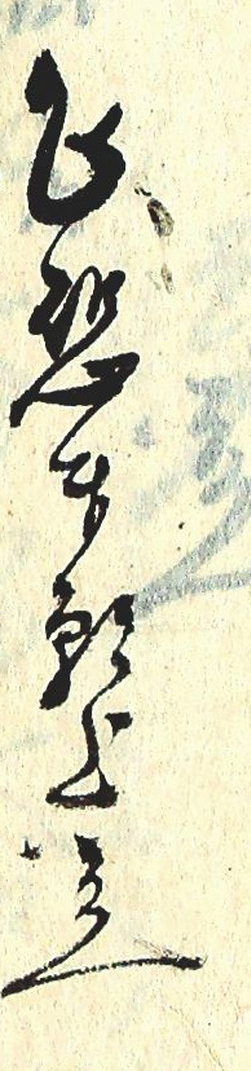乍恐奉願上覚
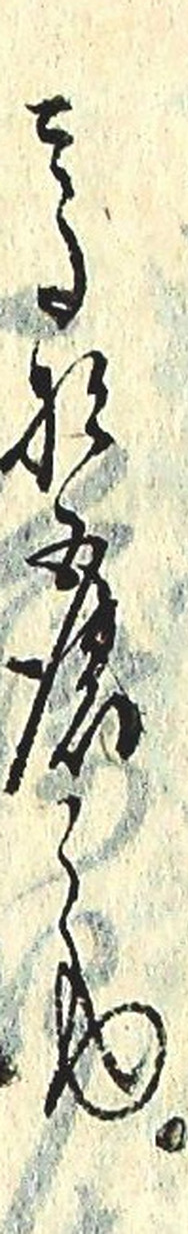高拾五俵之内
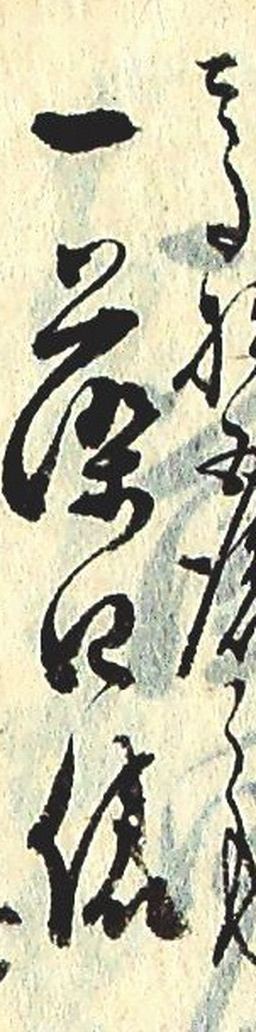一蒅四俵
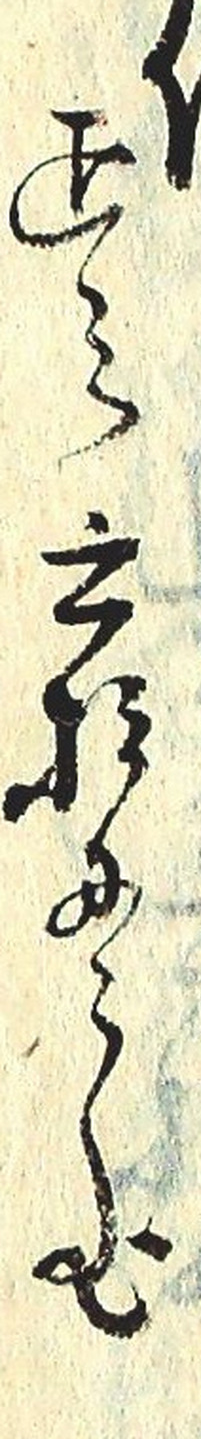正み六拾貫匁
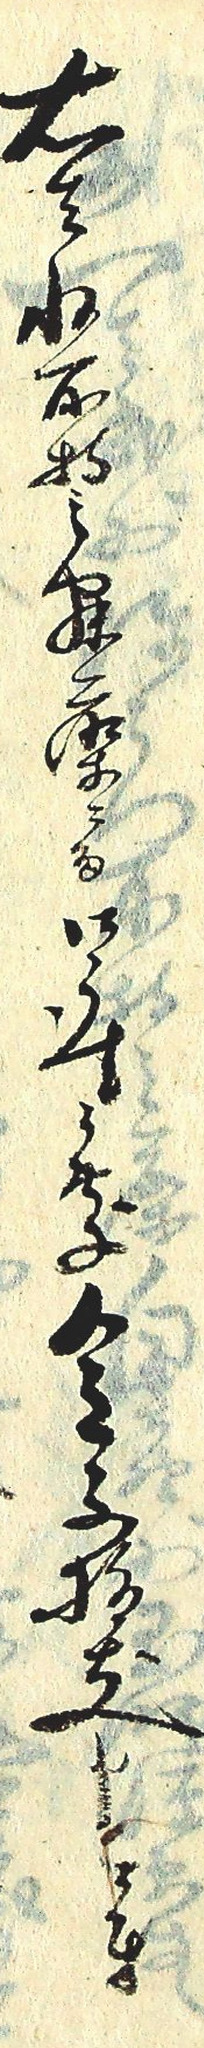右は私所持之寐蒅にて御座候処金子指支申に付
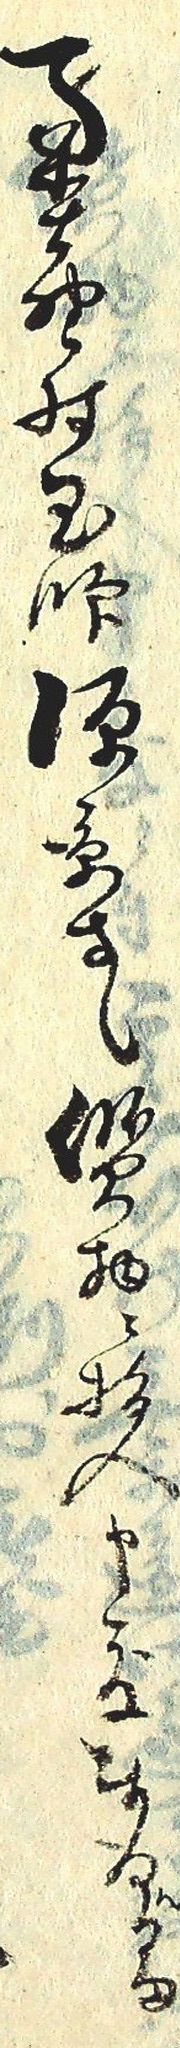奥野村玉師源兵衛方へ質物に指入申度奉存候間
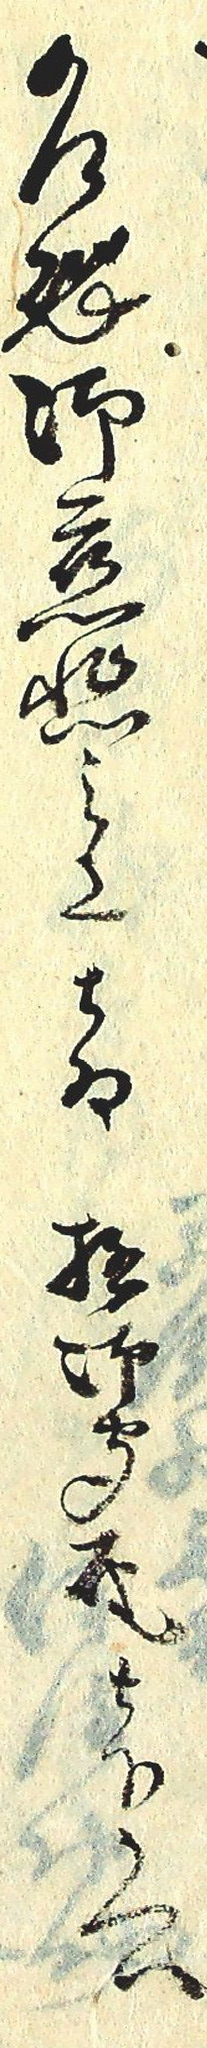乍恐御慈悲之上被為遊御聞届被下候へは
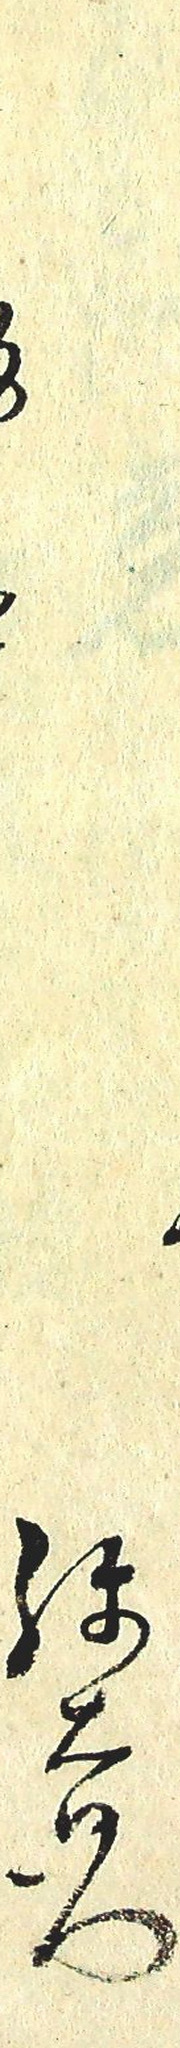弥右衛門
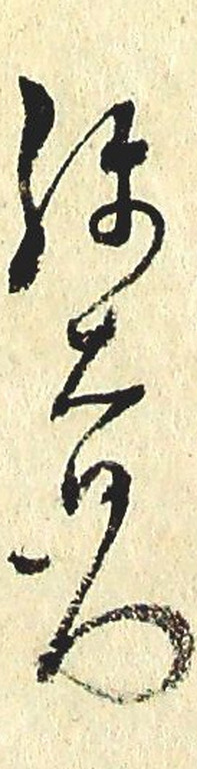弥右衛門
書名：諸御願書控(弐番）
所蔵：鳴門教育大学 Naruto University of Education
